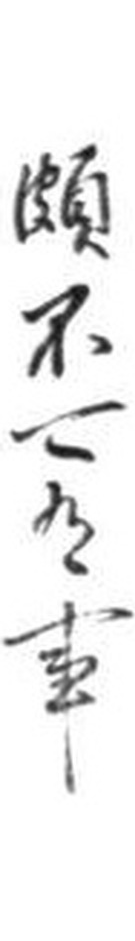頗不可有事
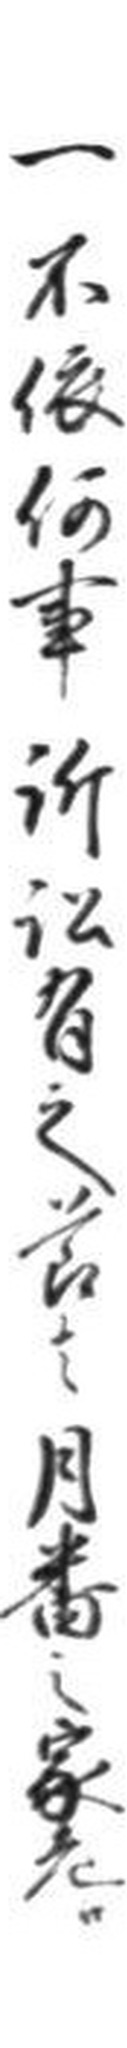一不依何事訴訟有之節者月番之家老江
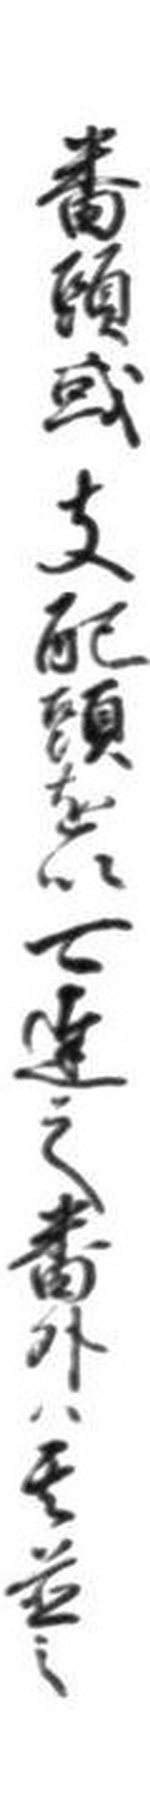番頭或支配頭を以可達之番外ハ其並之
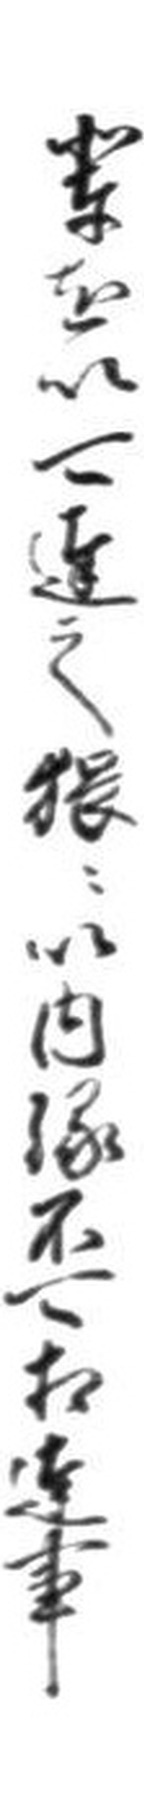輩を以可達之猥ニ以内縁不可相達事
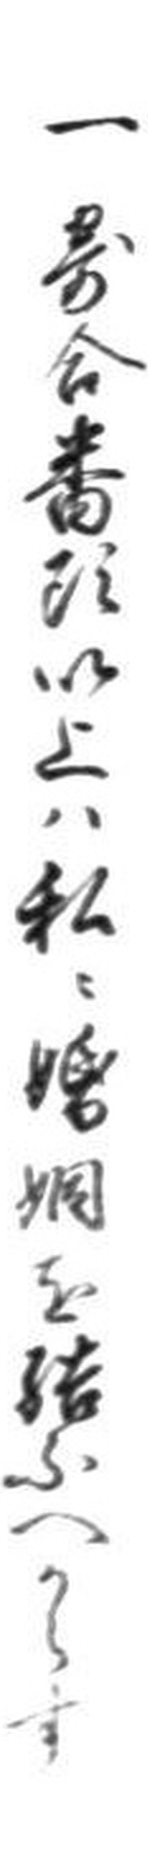一寄合番頭以上ハ私ニ婚姻を結ふへからす
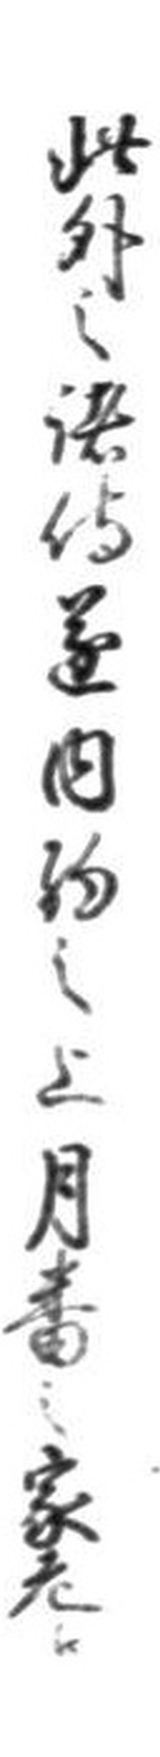此外之諸侍遂内約之上月番之家老江
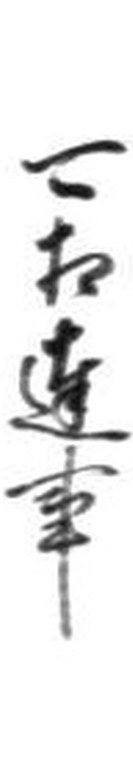可相達事
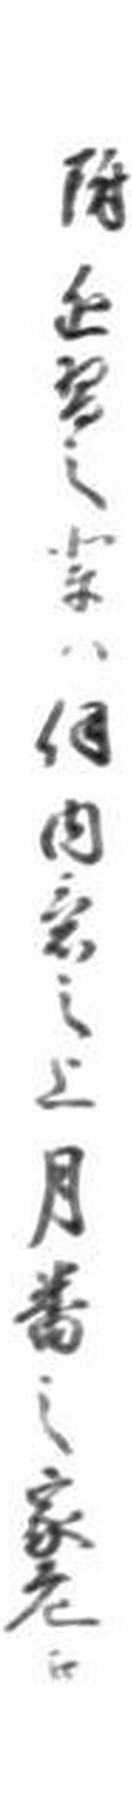附近習之輩は伺内意之上月番之家老江
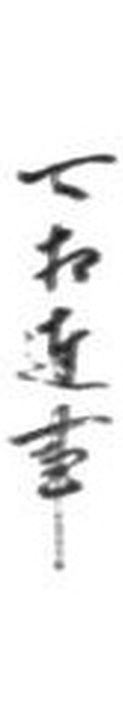可相達事
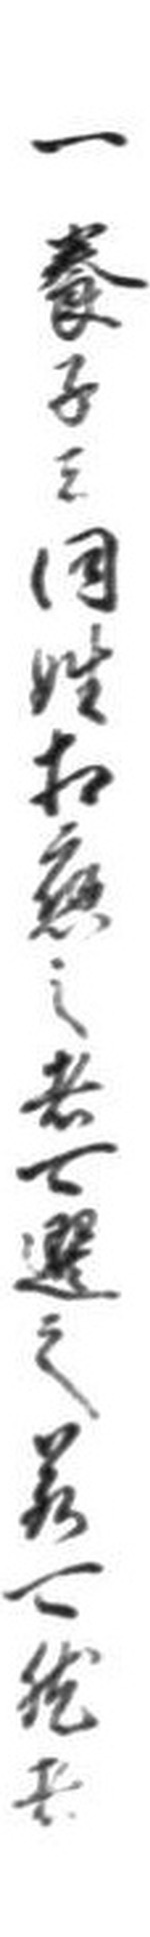一養子者同姓相応之者可選之若可然者
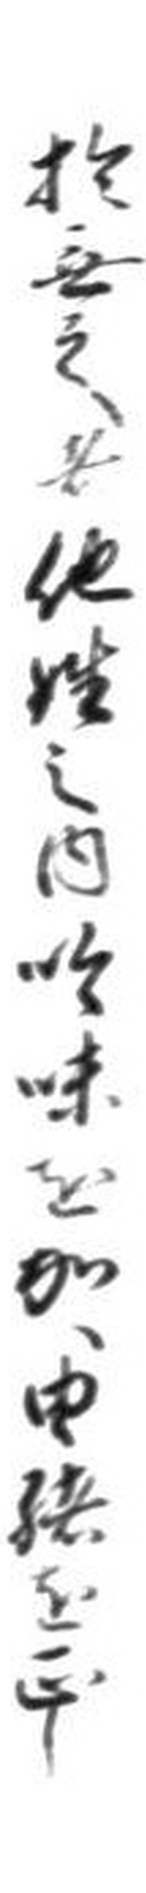於無之者他姓之内吟味を加へ由緒を正し

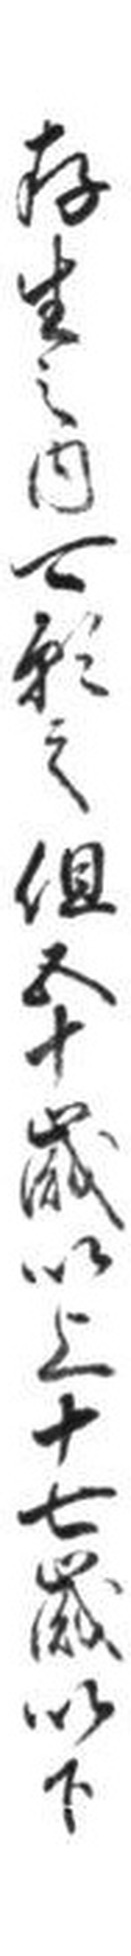存生之内可願之但五十歳以上十七歳以下
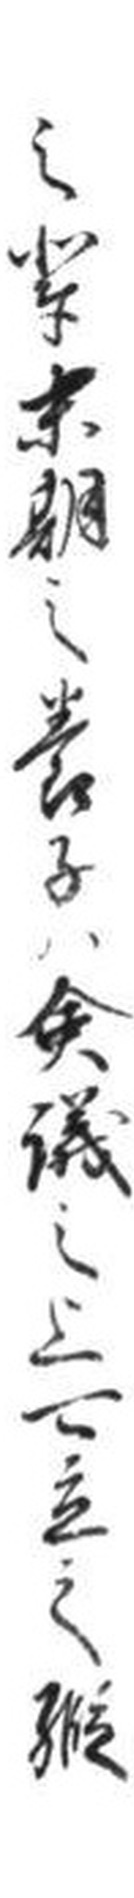之輩末期之養子は僉議之上可立之縦
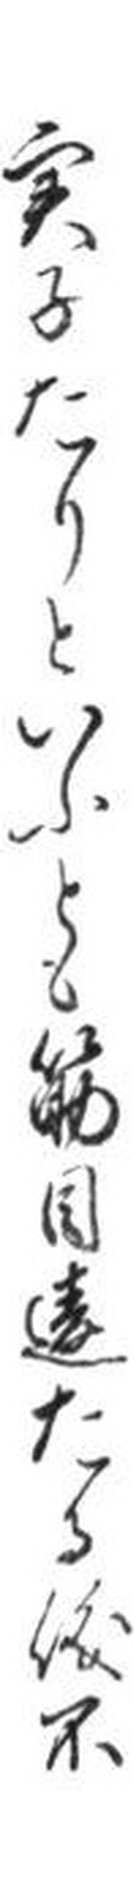実子たりといふとも筋目違たる儀不
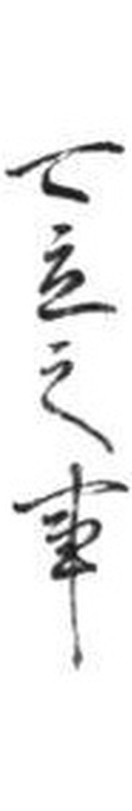可立之事
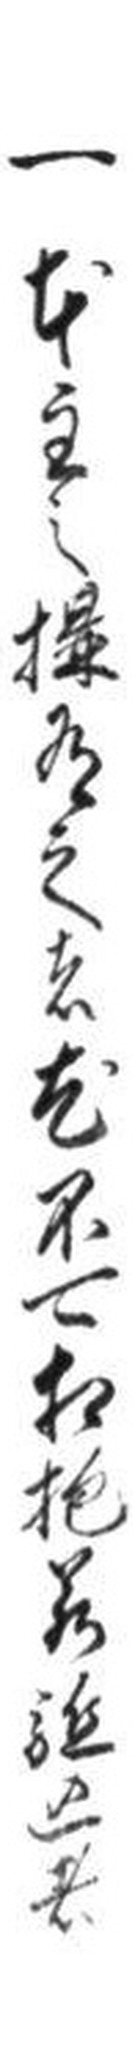一本主之構有之者尤不可相抱若駈込者
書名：家譜 十六 吉品公 従貞享三年閏三月到同四年
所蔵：福井県文書館 Fukui Prefectural Archives
